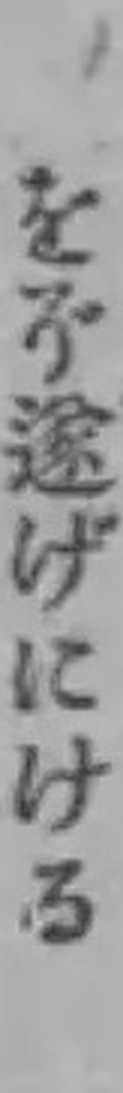をぞ遂げにける
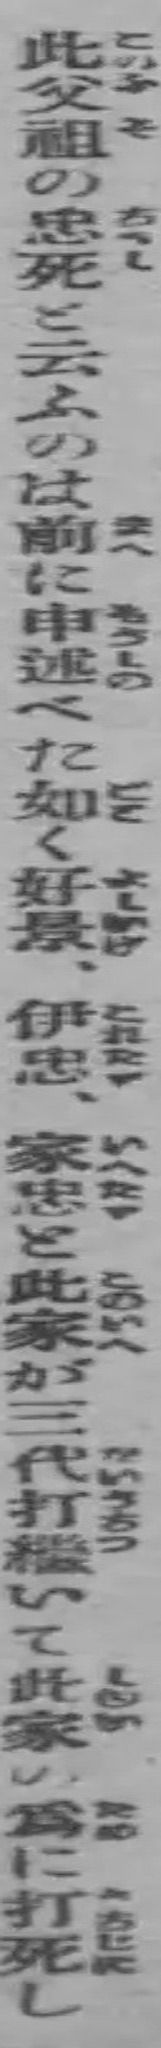此父祖の忠死と云ふのは前に申述べた如く好景、伊忠、家忠と此家が三代打継いて此家の為に打死し
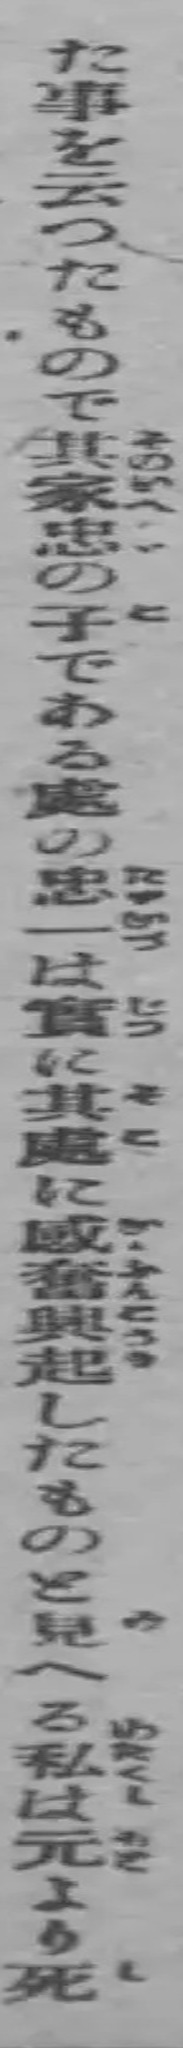た事を云つたもので其家忠の子である処の忠一は実に其処に感奮興起したものと見へる私は元より死
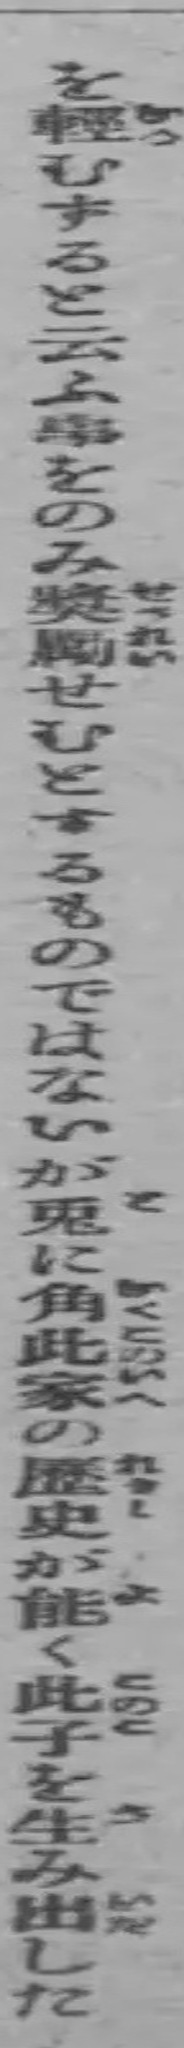を軽むずると云ふ事をのみ奨励せむとするものではないが兎に角此家の歴史が能く此子を生み出した
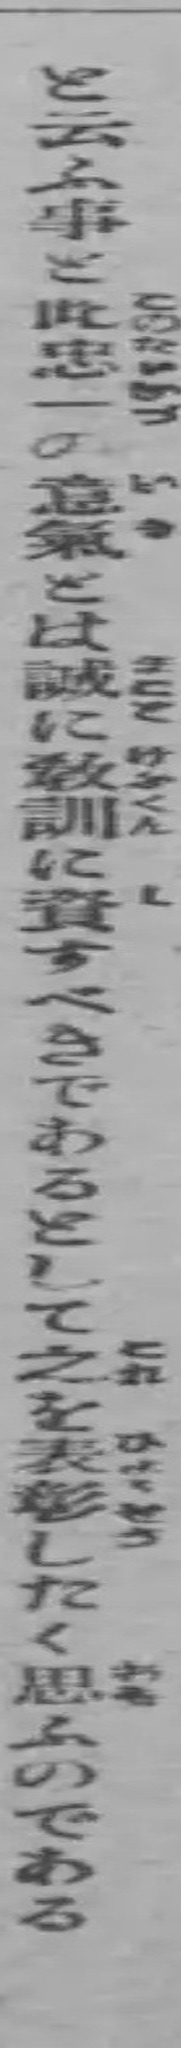と云ふ事と此忠一の意気とは誠に教訓に資すべきであるとして之を表彰したく思ふのである
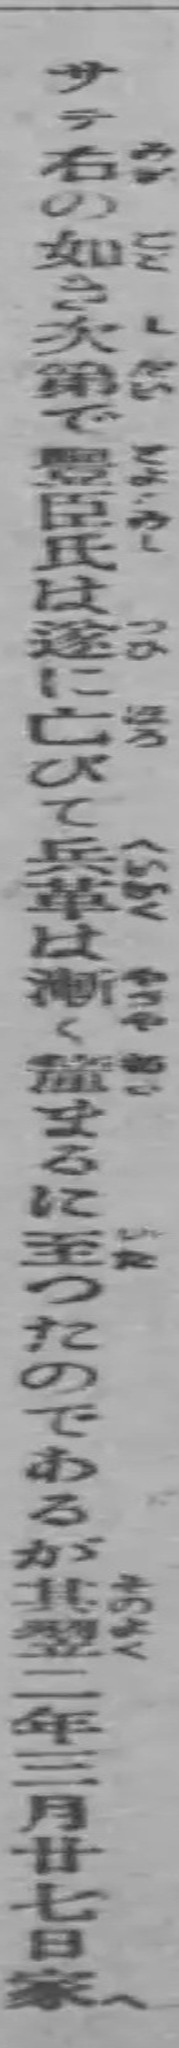サテ右の如き次第で豊臣氏は遂に亡びて兵革は漸く釐まるに至つたのであるが其翌二年三月廿七日家
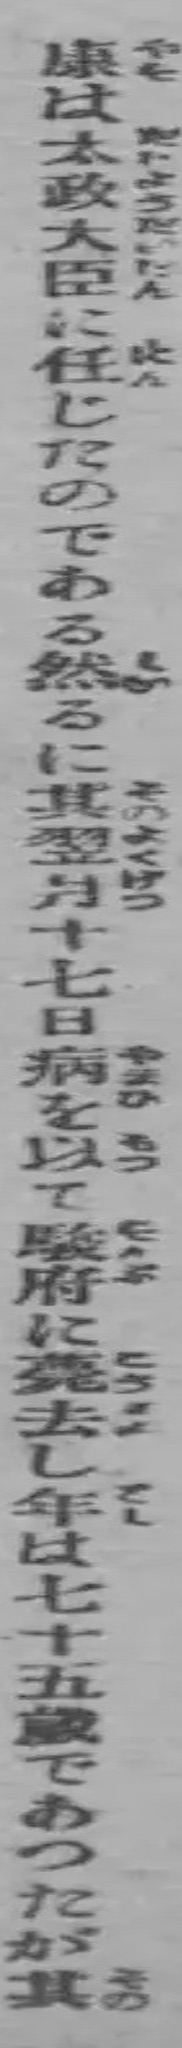家康薨去康は太政大臣に任じたのである然るに其翌月十七日病を以て駿府に薨去し年は七十五歳であつたが其
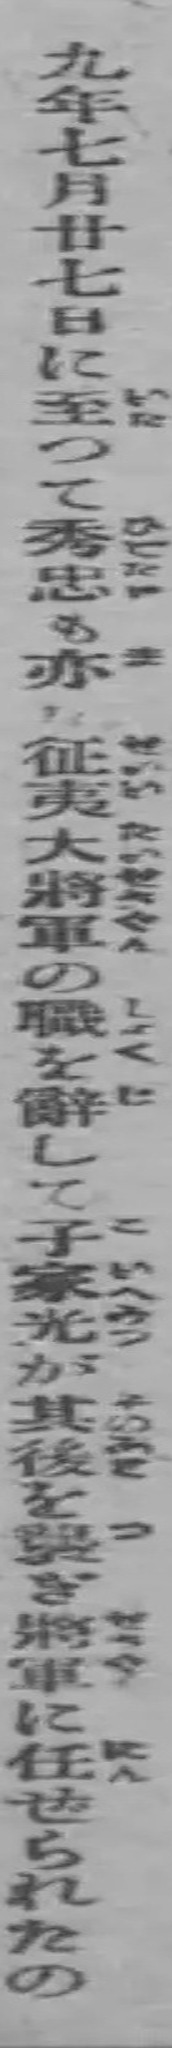秀忠辞職九年七月廿七日に至つて秀忠も亦た征夷大将軍の職を辞して子家光が其後を襲ぎ将軍に任ぜられたの
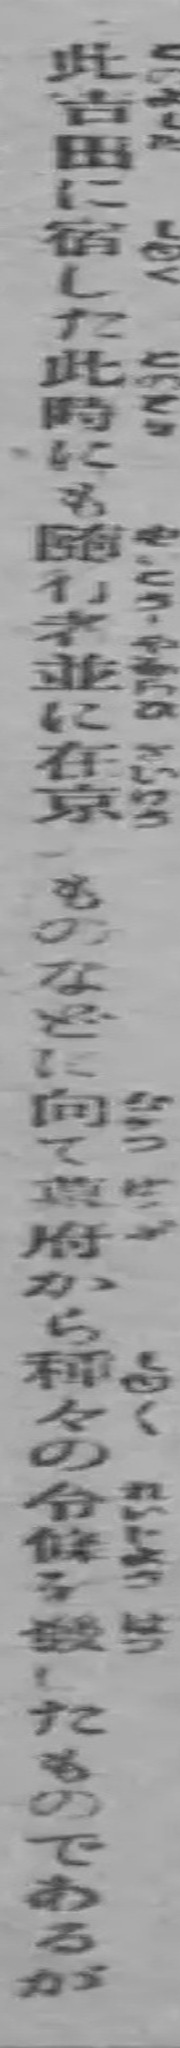秀忠の上洛此吉田に宿した此時にも随行者並に在京のものなどに向て幕府から種々の令条は発したものであるが
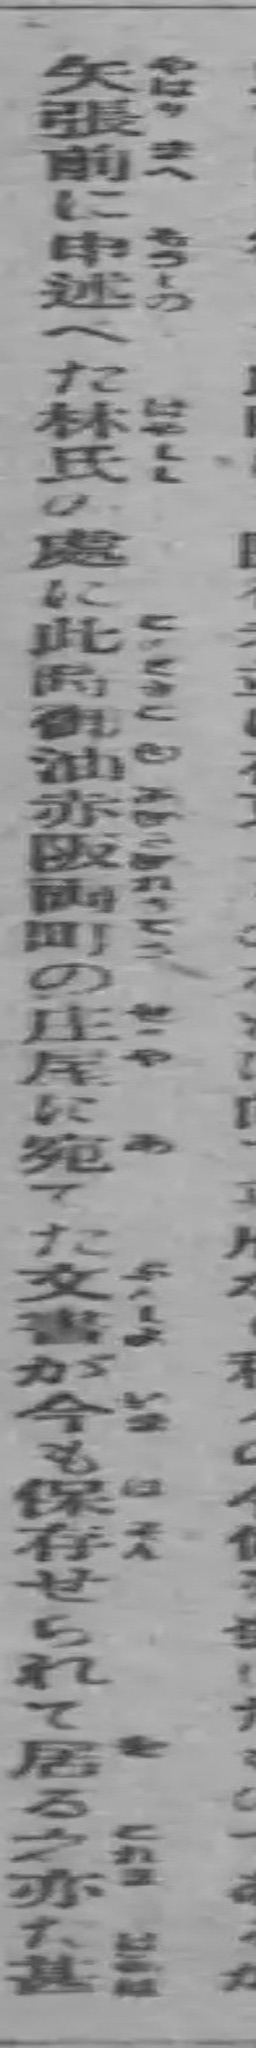林文書矢張前に申述べた林氏の処に此時御油赤阪両町の庄屋に宛てた文書が今も保存せられて居る之亦た甚

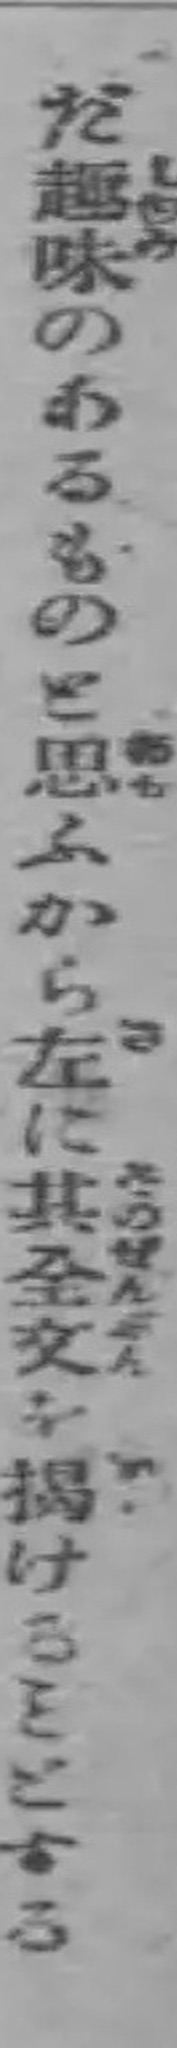だ趣味のあるものと思ふから左に其全文を掲げることとする
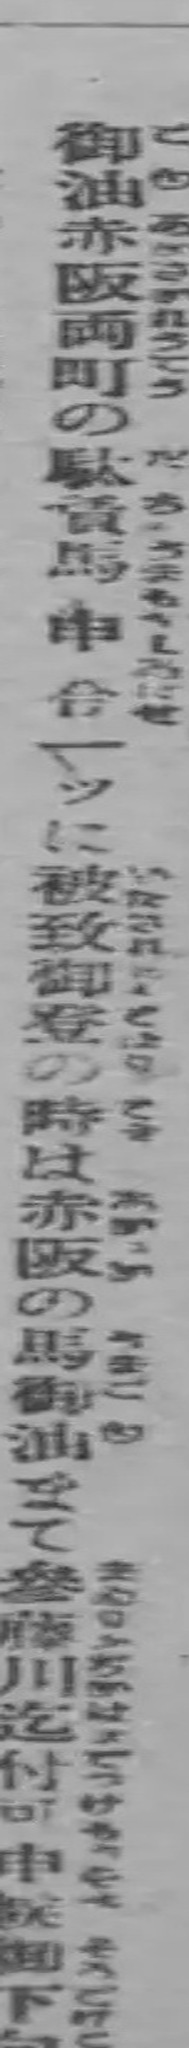御油赤阪両町の駄賃馬申合一ツに被致御登の時は赤阪の馬御油まて参藤川迄付可申候御下向の時
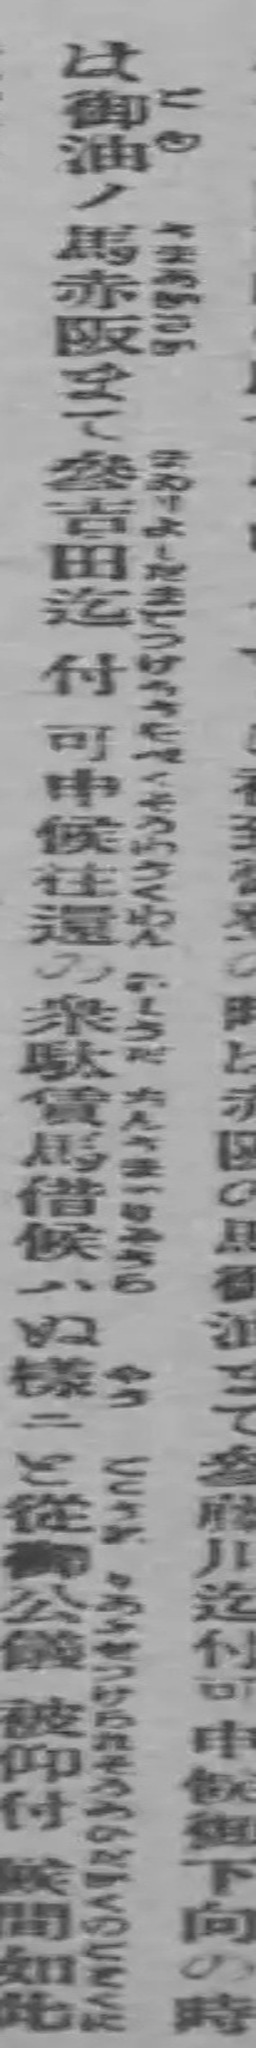は御油ノ馬赤阪まて参吉田迄付可申候往還の衆駄賃馬借候ハぬ様ニと従御公儀被仰付候間如此
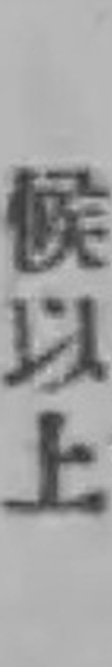候以上
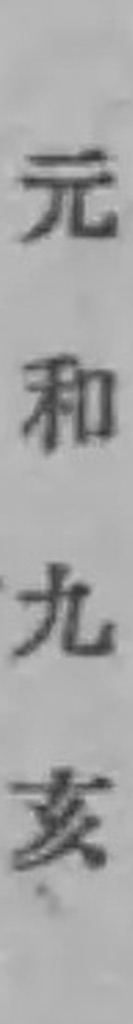元和九亥
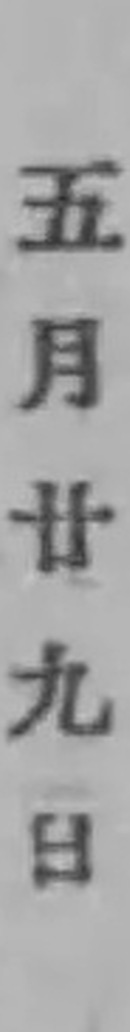五月廿九日
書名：豊橋市史談
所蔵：国立国会図書館 National Diet Library, JAPAN
